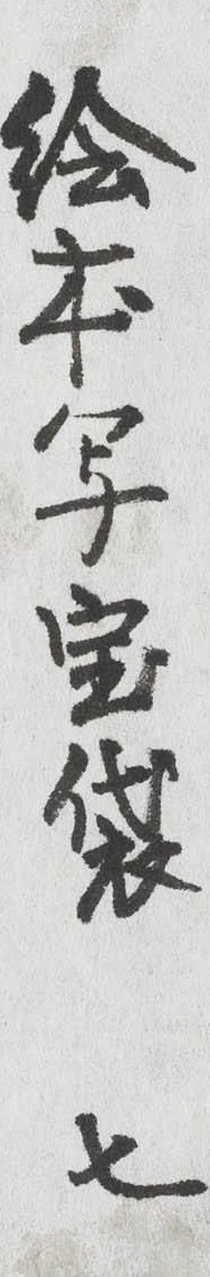絵本写宝袋七
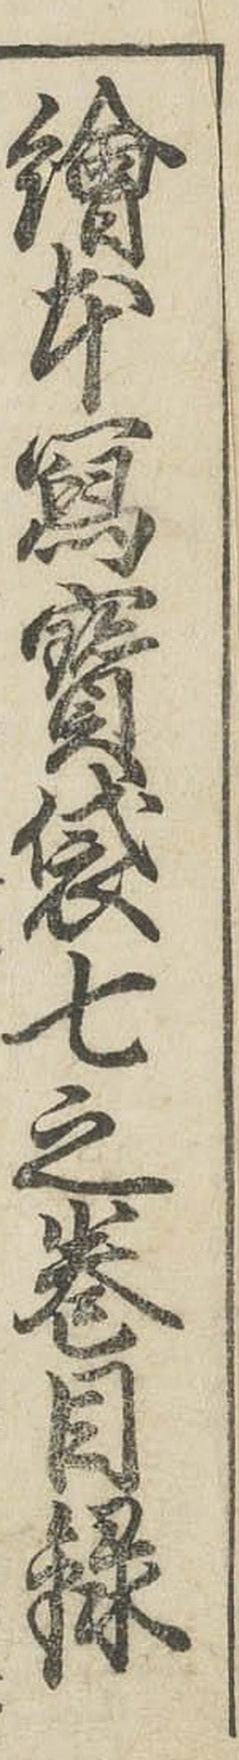絵本写宝袋七之巻目録
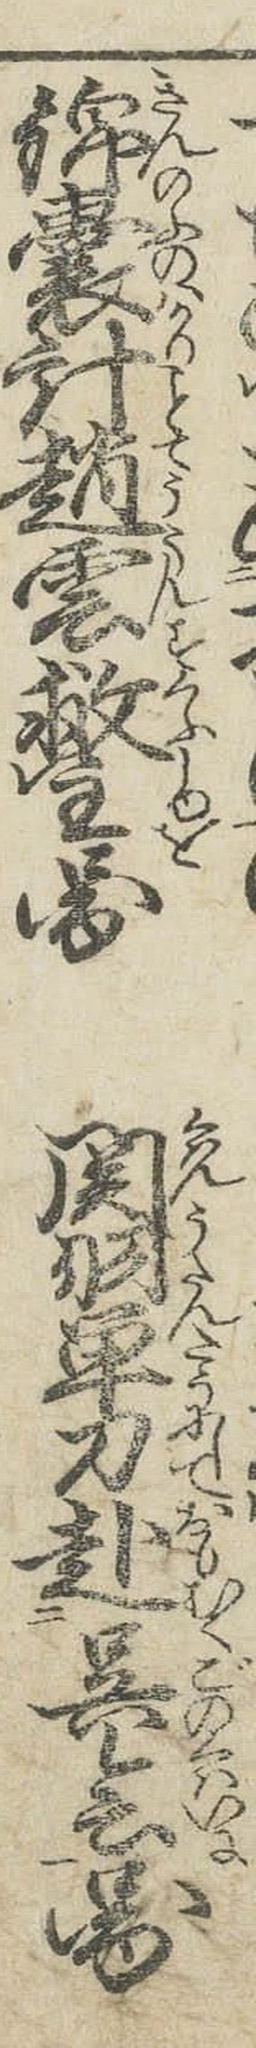錦嚢計趙雲救主図関羽単刀赴呉会図
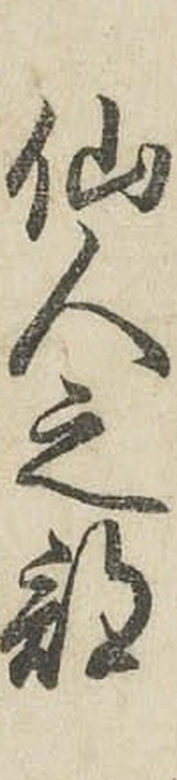仙人之部

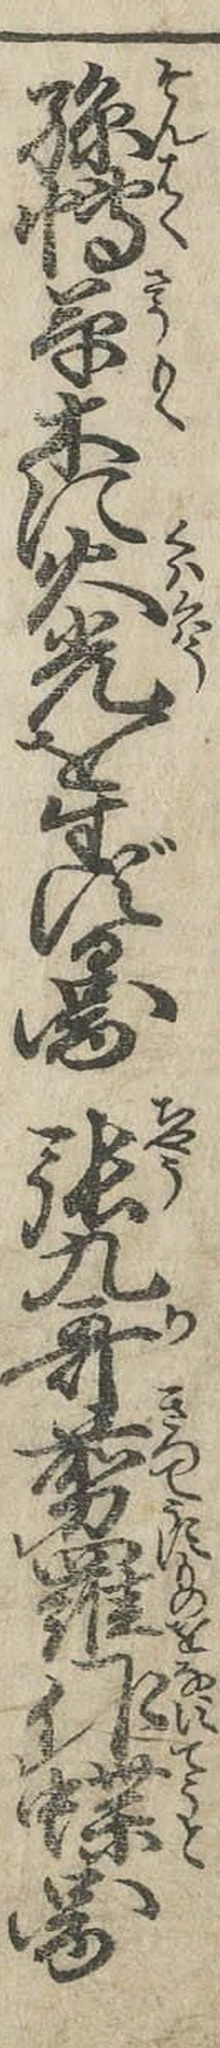孫博草木に火光を生ず図張九哥剪羅作蝶図
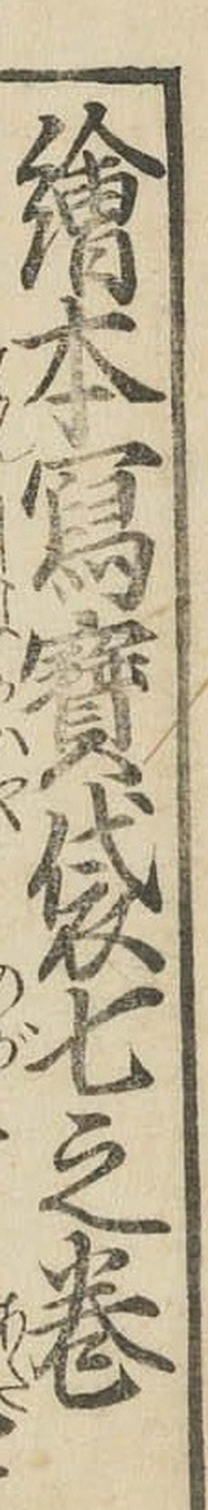絵本写宝袋七之巻
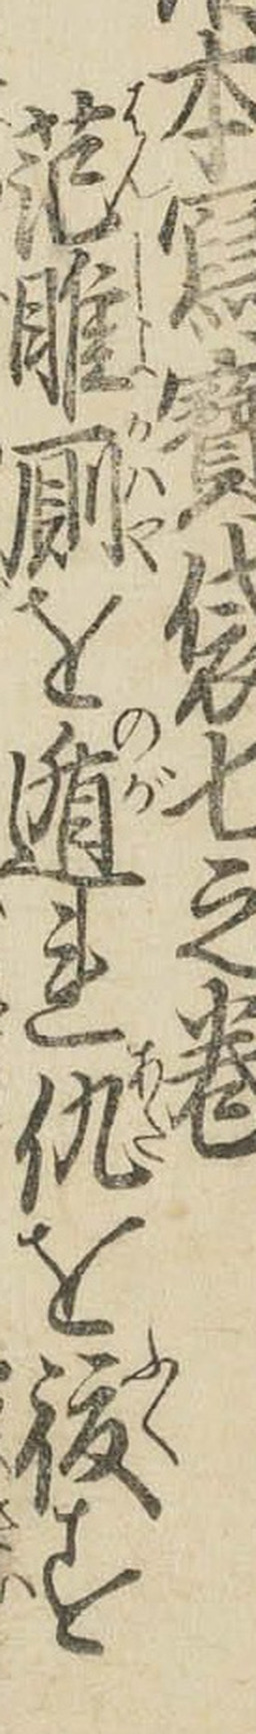范雎厠を遁れ仇を復す
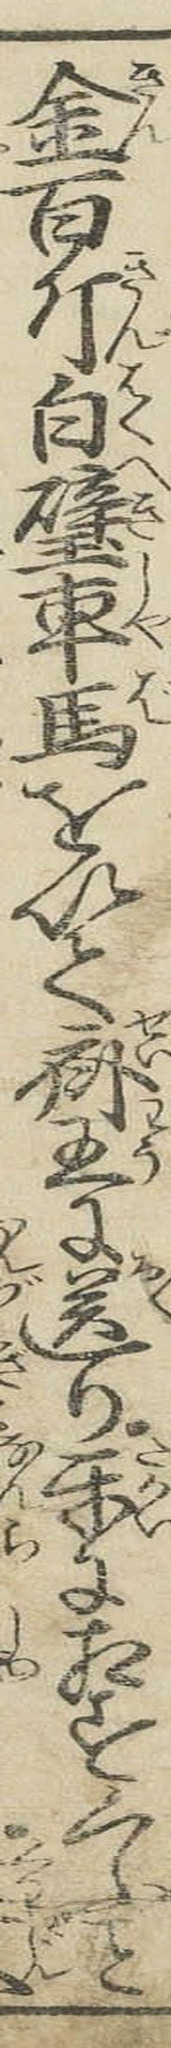金百斤白璧車馬を以て斉王に送り。互に相すくふこと
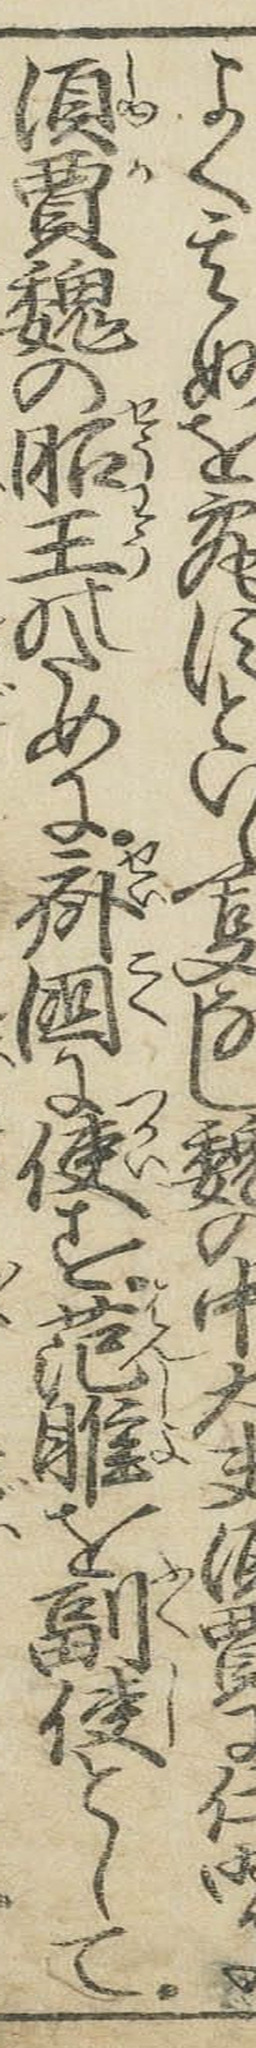須賈魏の昭王のために。斉国に使す。范雎を副使として。
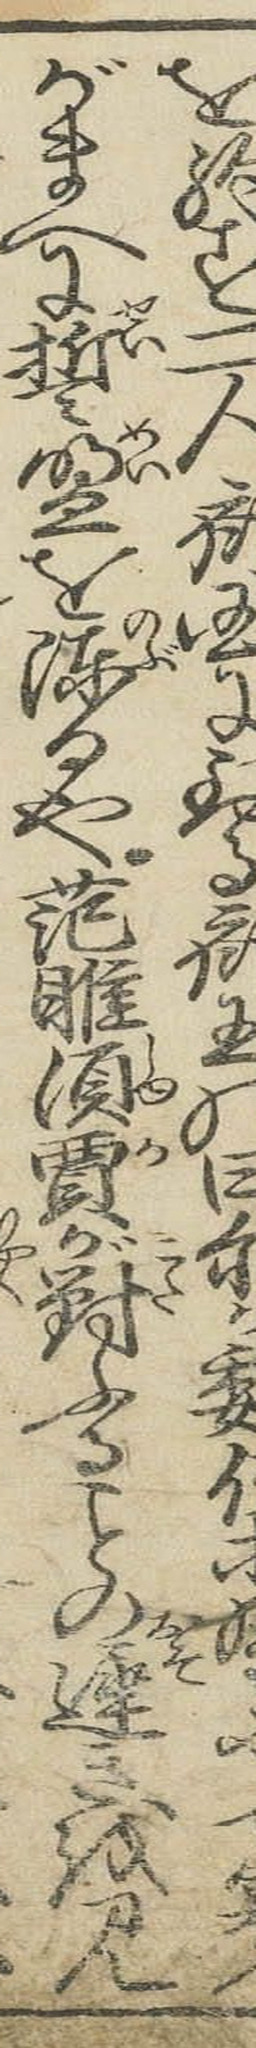がまへに誓盟を陳るや。范雎須賈が対ふることの遅きを見
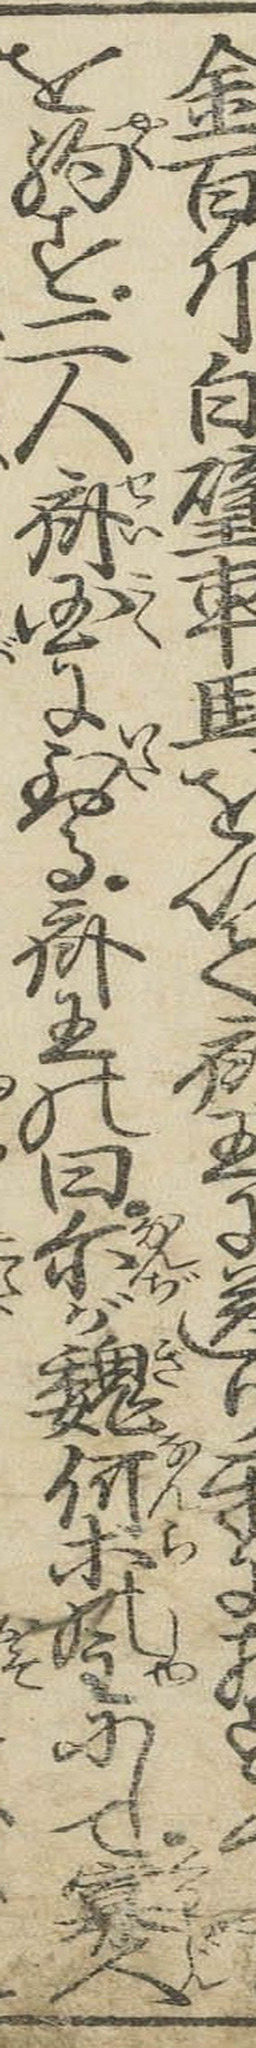を約す。二人斉国に到る。斉王の曰。尓が魏何等の主にして。寡人
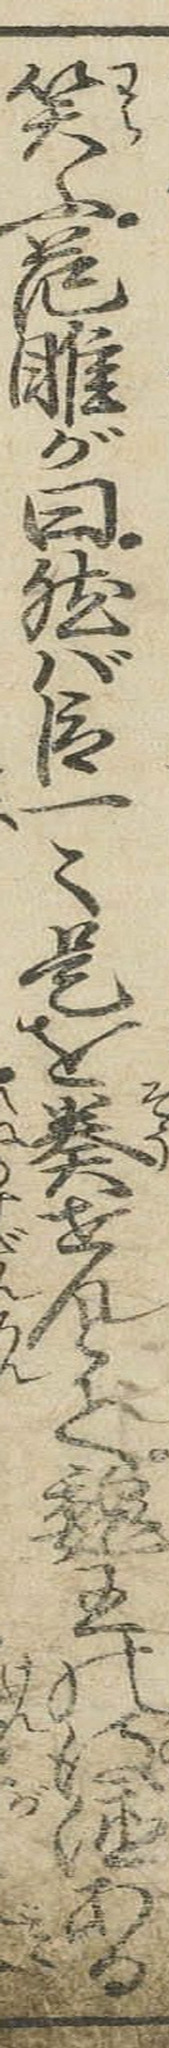笑ふ。范雎が曰。然ば臣一々是を奏せんとて。魏王の彼徳ある
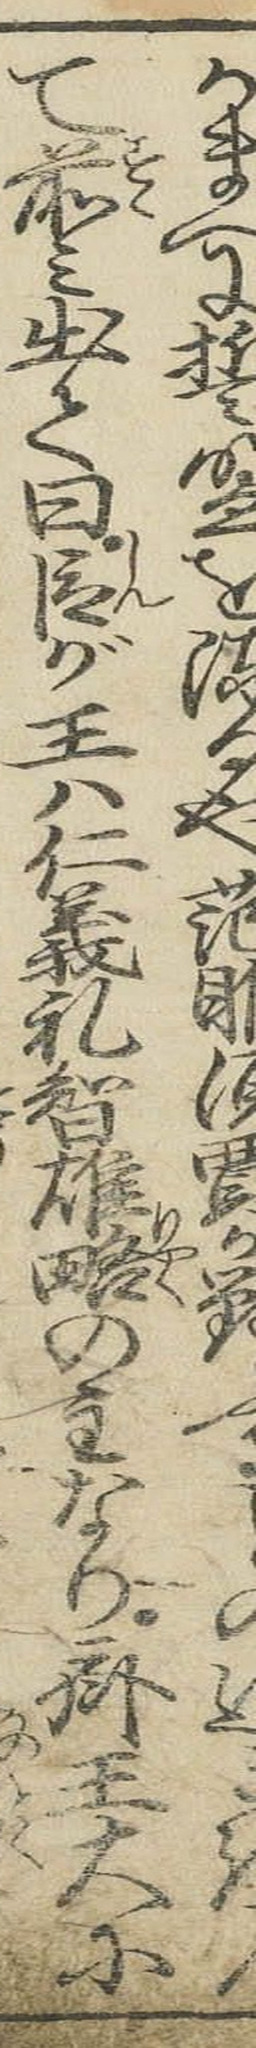て前み出て曰。臣が王は仁義礼智雄略の主なり。斉王大に
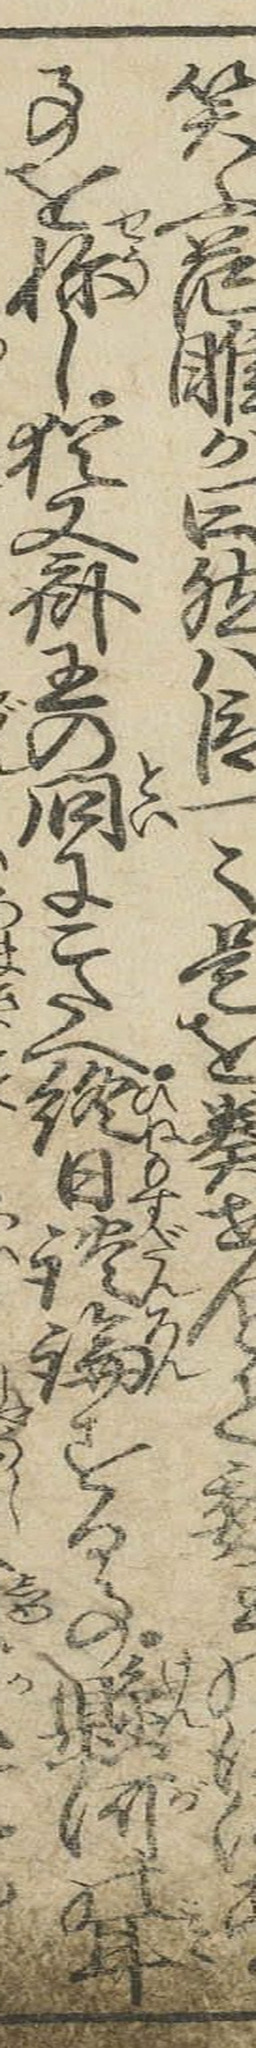事を称し。猶又斉王の問にこたへ。終日談論する事。懸河の耳
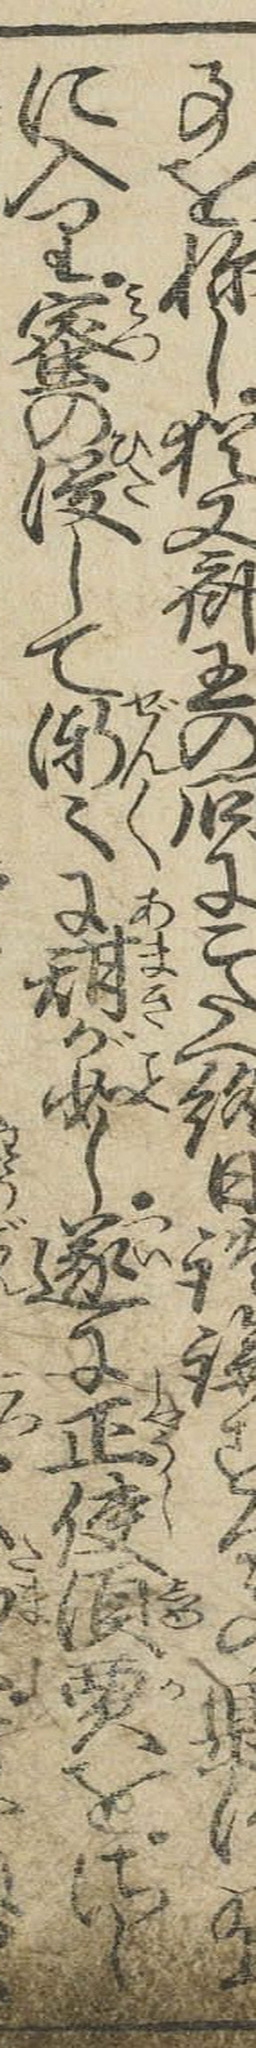に入り。蜜の浸して漸々に甜が如し。遂に正使須賈を。さし
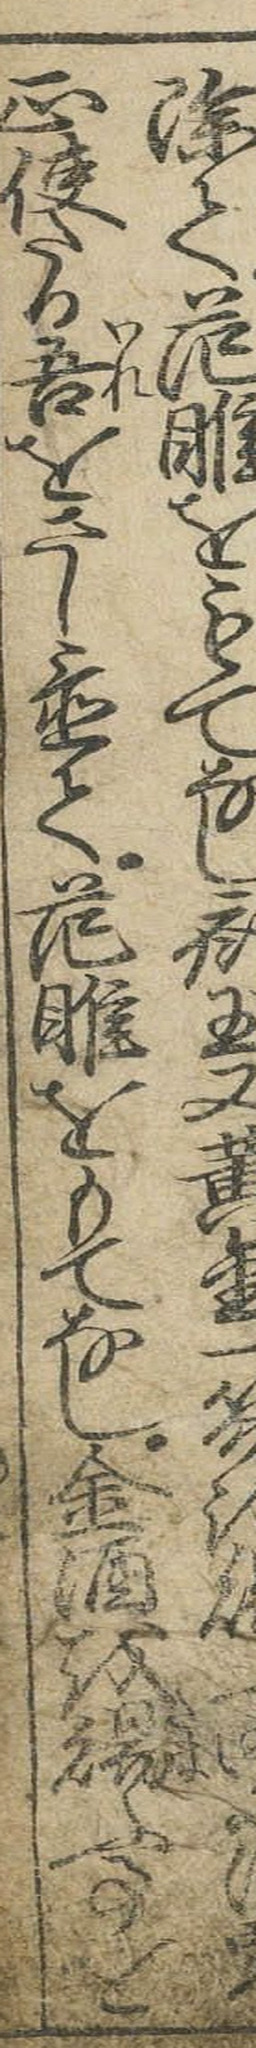正使たる吾をさし置て。范雎をもてなし。金酒を賜ふ事を
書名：絵本写宝袋 9巻 7之巻
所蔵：東京学芸大学教育コンテンツアーカイブ
